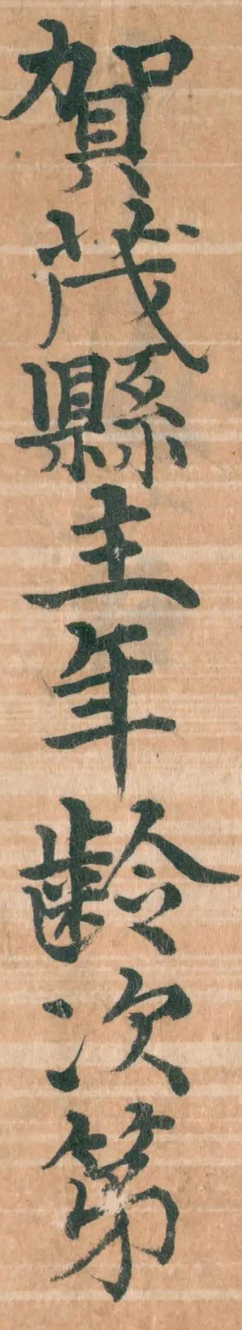賀茂縣主年齢次第
